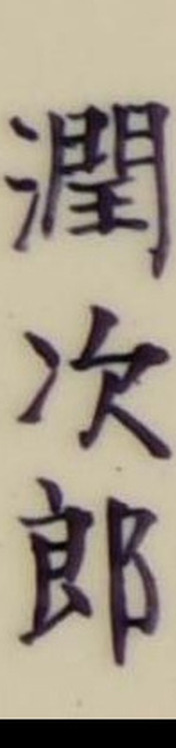潤次郎

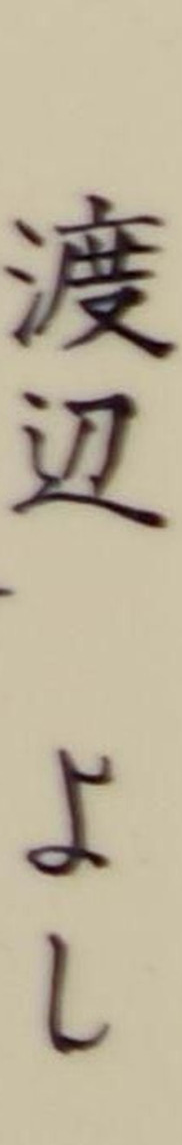渡辺よし
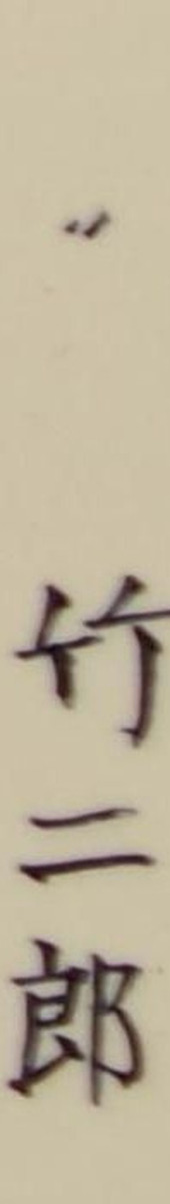竹二郎
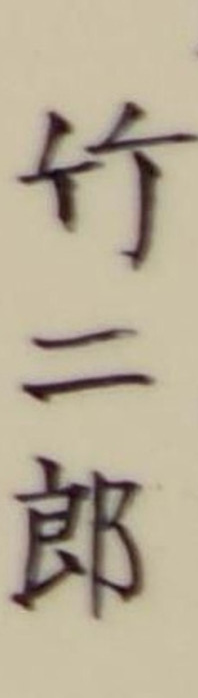竹二郎
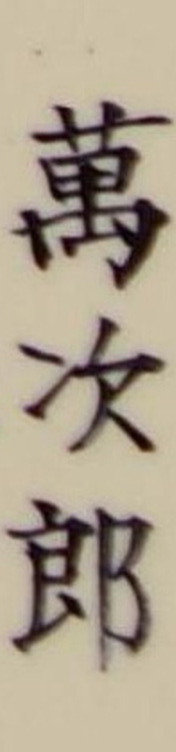萬次郎
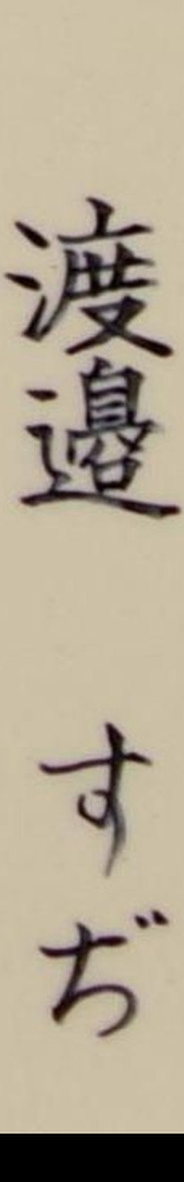渡辺すぢ
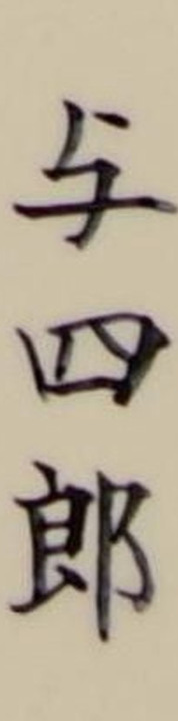与四郎
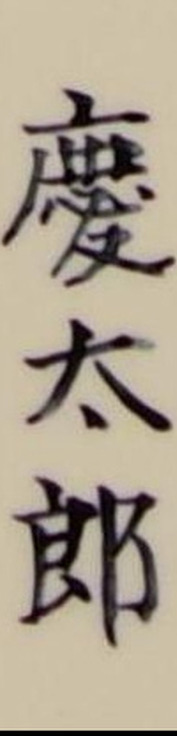慶太郎
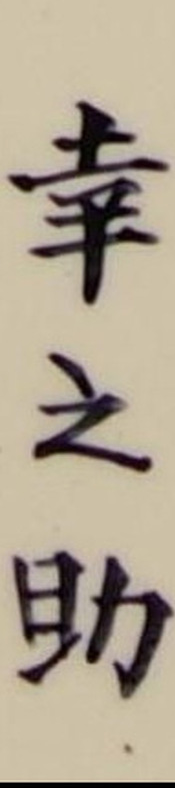幸之助
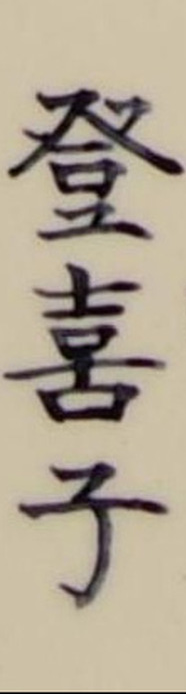登喜子
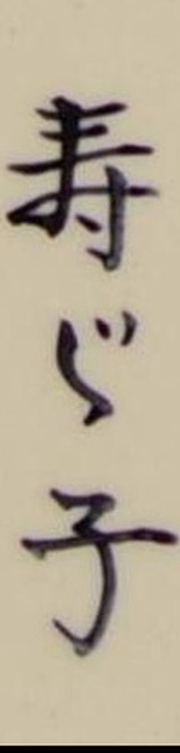寿ゞ子
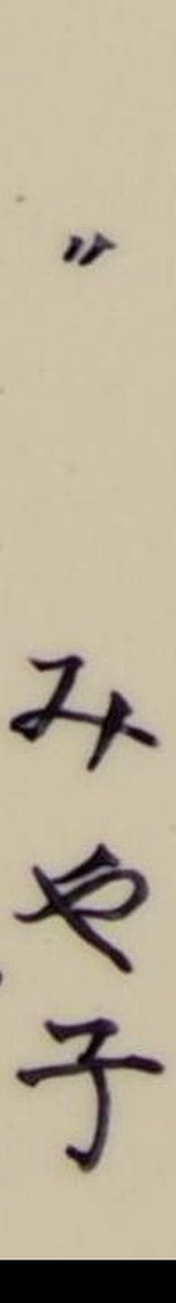みや子
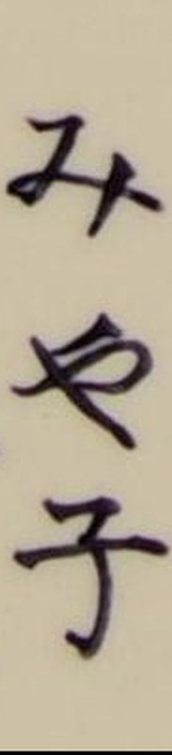みや子
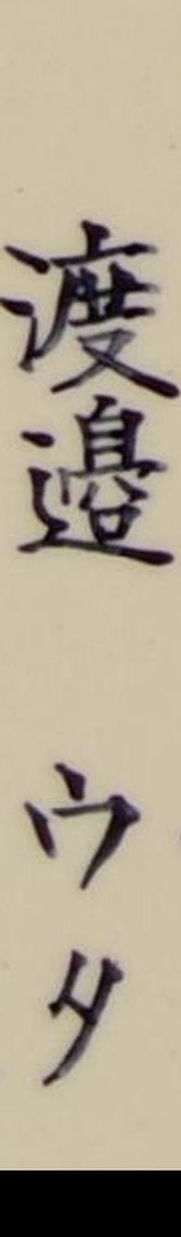渡辺ウタ

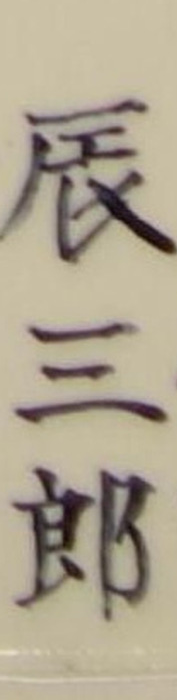辰三郎
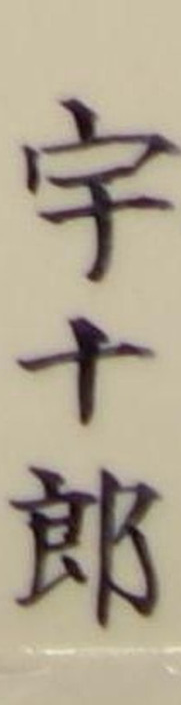宇十郎
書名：E~L
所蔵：高野山金剛峯寺
